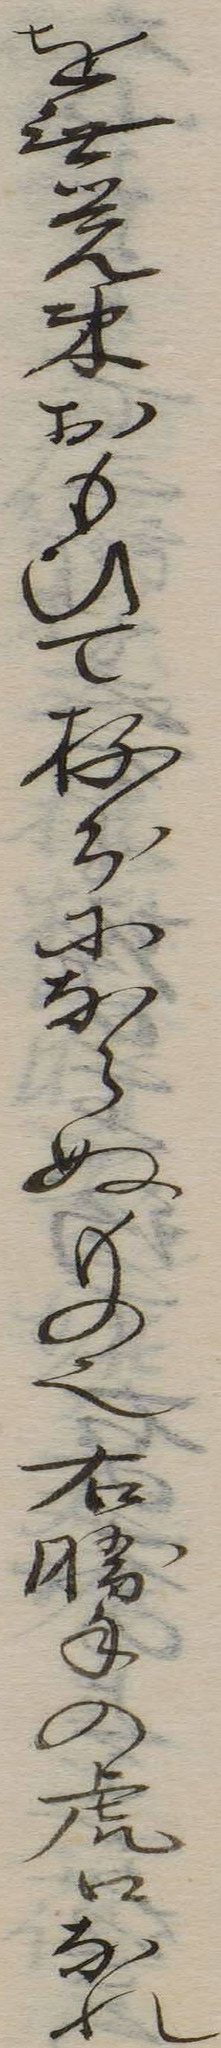を無覚束おもひて存分にならぬもの也右勝手の虎口なれ
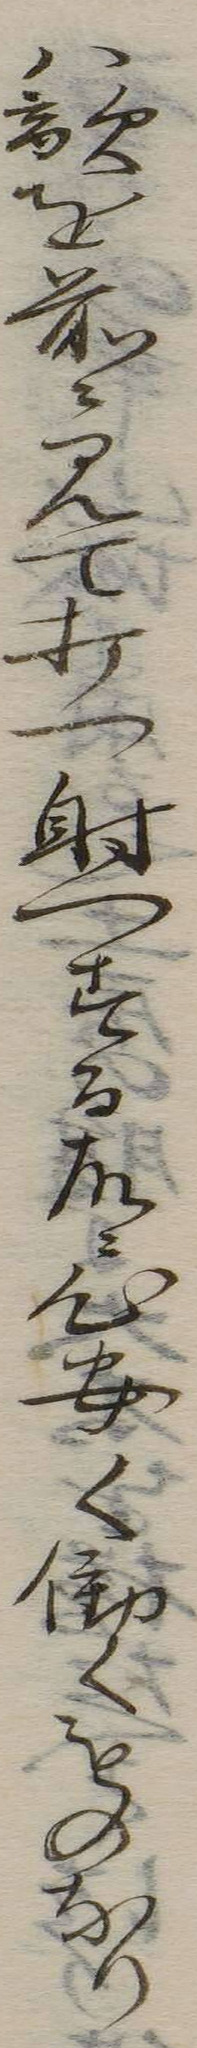は敵を前々見て打つ射つする故ニ心安く働くものなり
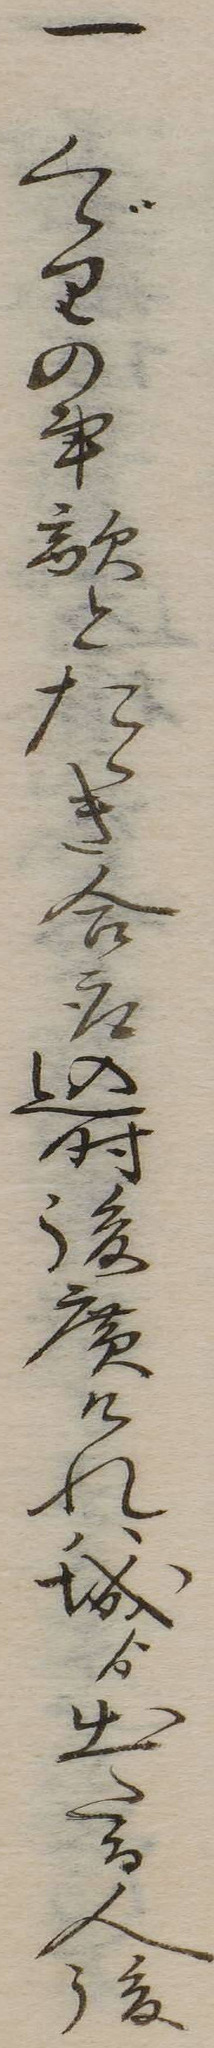一くゞりの事敵とたゝき合取込時後広けれは城ゟ出たる人後

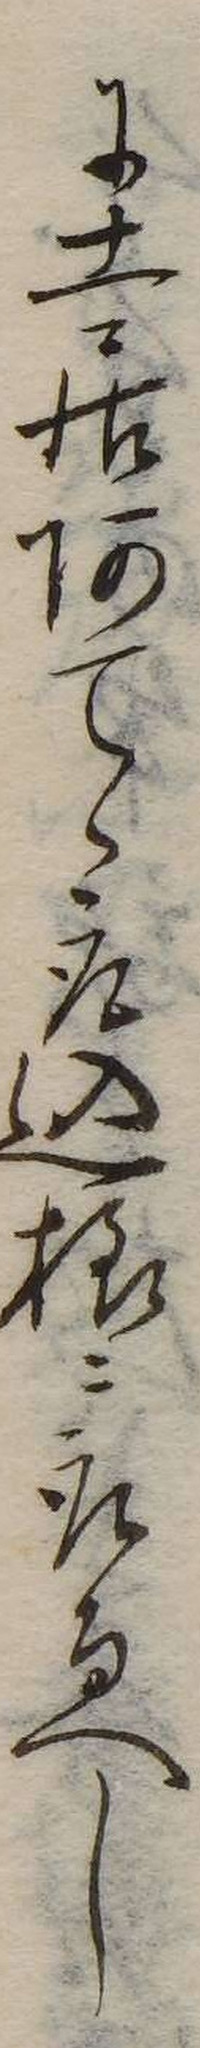に土居あてゝ取込様ニ取るへし
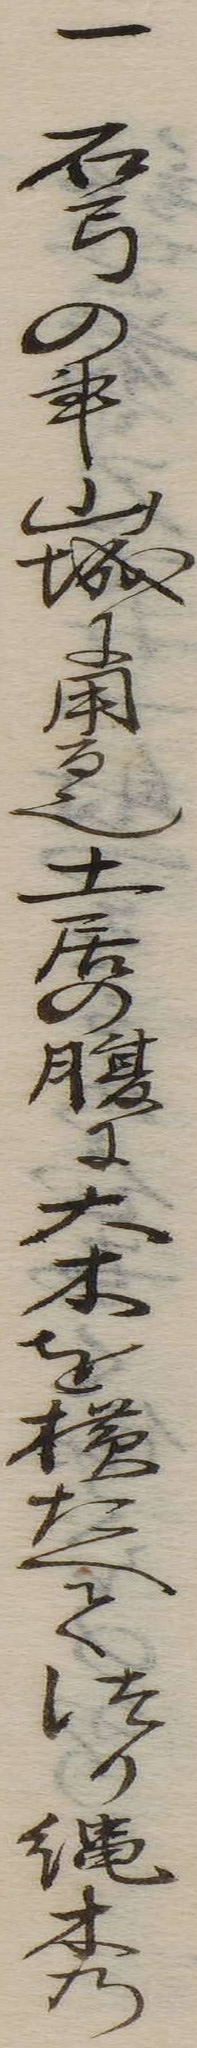一石弓の事山城に用る也土居の腹に大木を横たへてつり縄木の
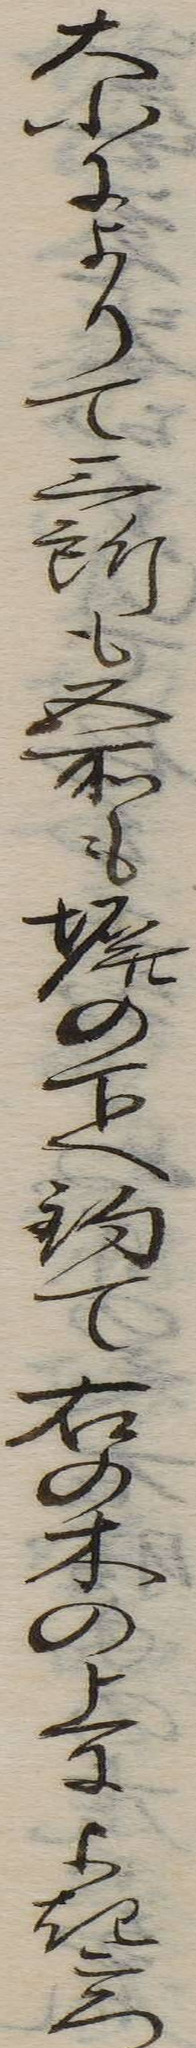大小によりて三所も五所も塀の下へ釣て右の木の上によきころ
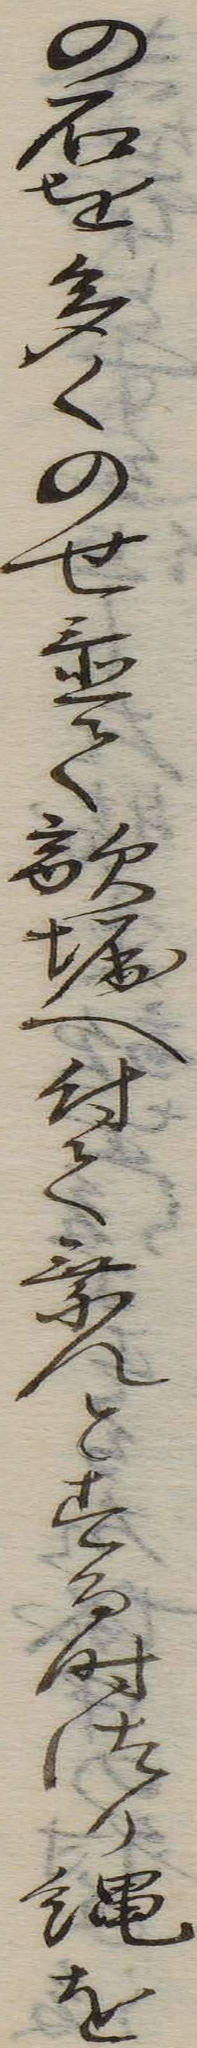の石を多くのせ置て敵堀へ付て乗んとする時つり縄を
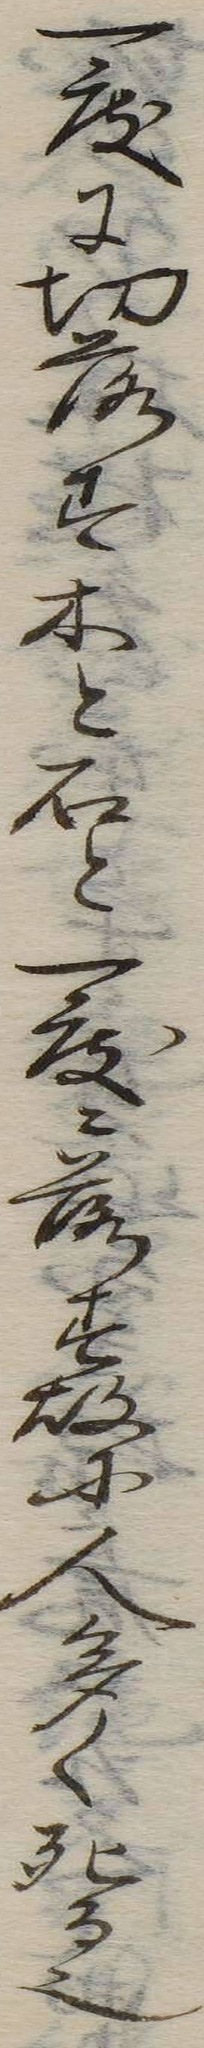一度に切落す木と石と一度に落す故に人多く死る也
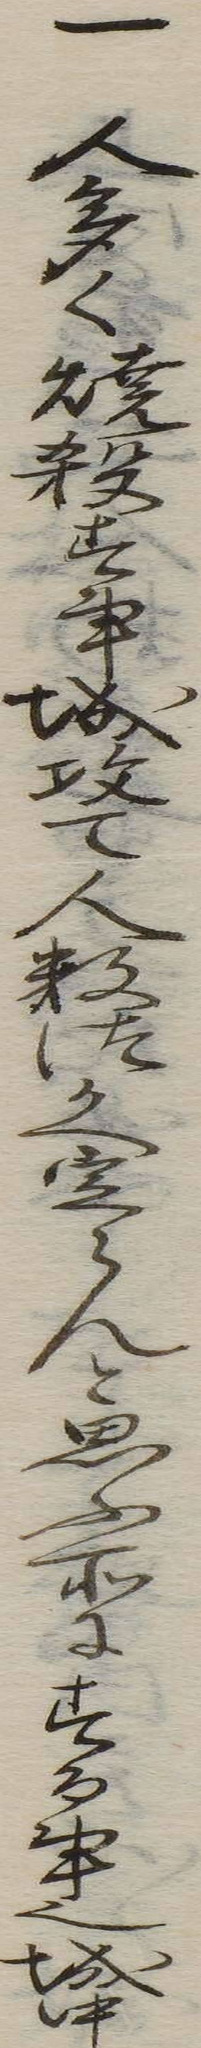一人多く焼殺す事城攻て人数つかへ定らんと思ふ所にする事也城中
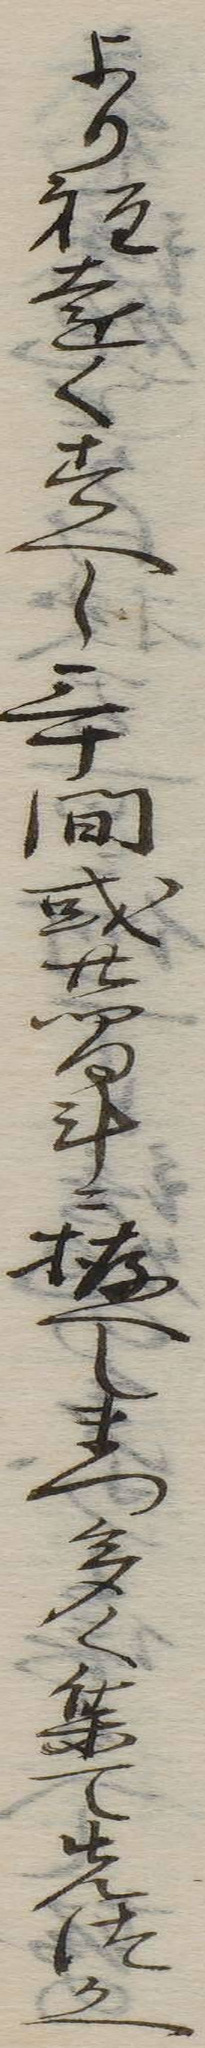より程遠くすへし三十間或廿間計ニ拵へしまつ多く集て先つかへ
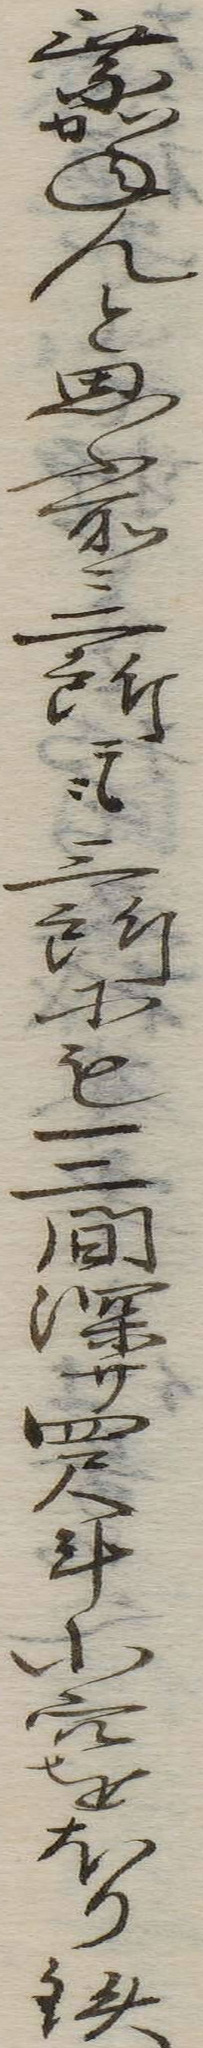乗かねんと思ふ所ニ二所ニも三所にも一二間深サ四尺計小穴をほり鉄
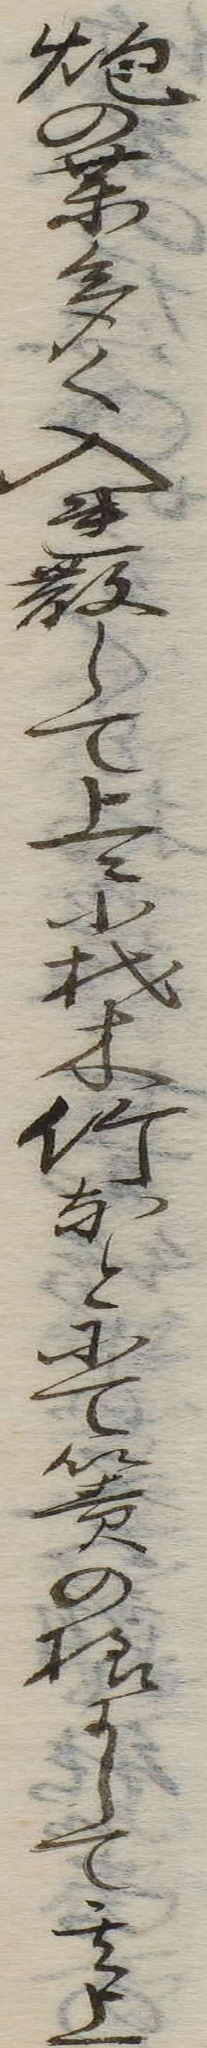炮の薬多く入れ散して上ニ小材木竹なとにて簀の様にして其上
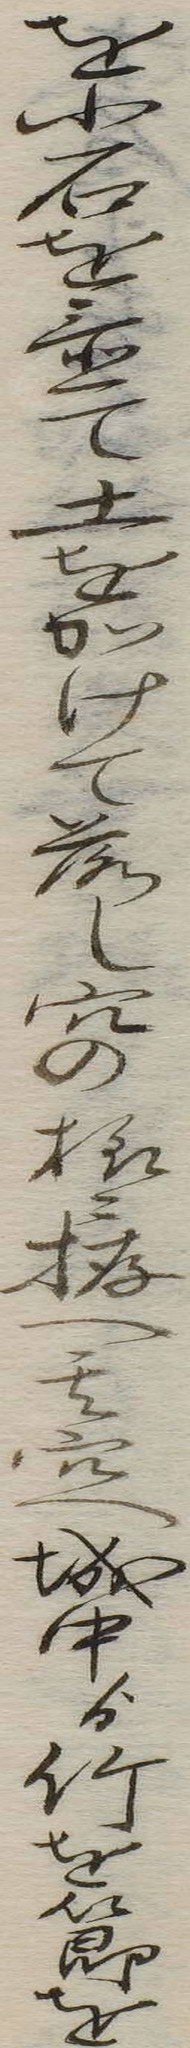を小石を置て土をかけて落し穴の様ニ拵へ其穴へ城中ゟ竹を節を
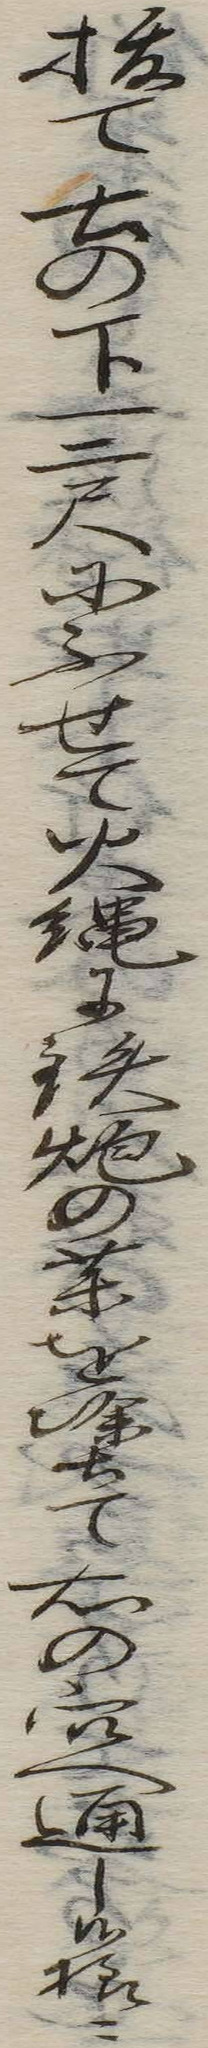抜て土の下一二尺にふせて火縄に鉄炮の薬を塗て右の穴へ通し候様ニ
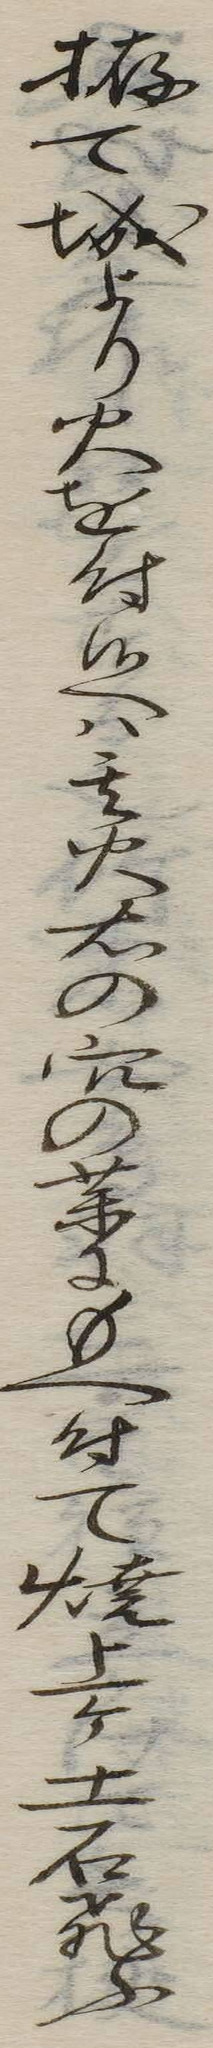拵て城より火を付候へは其火右の穴の薬にもへ付て焼上ケ土石飛ふ
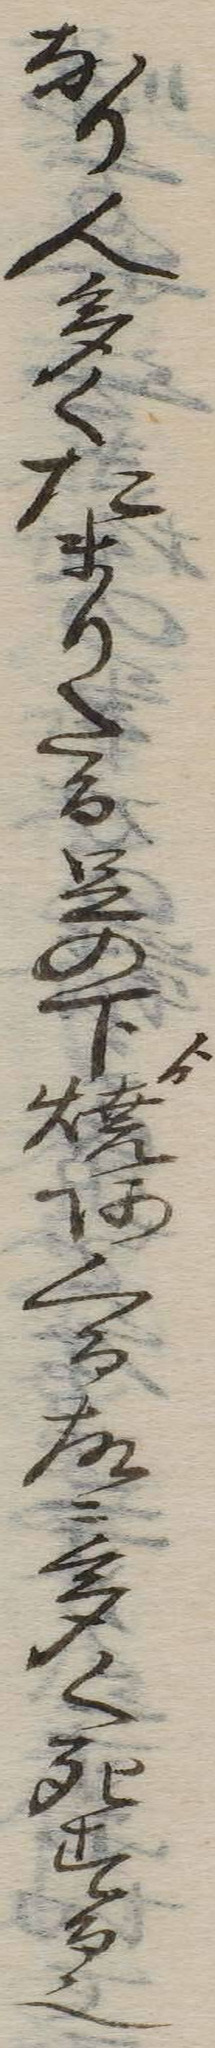なり人多くたまりたる足の下ゟ焼あくる故ニ多く死する也
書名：三河之物語
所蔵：国文学研究資料館
